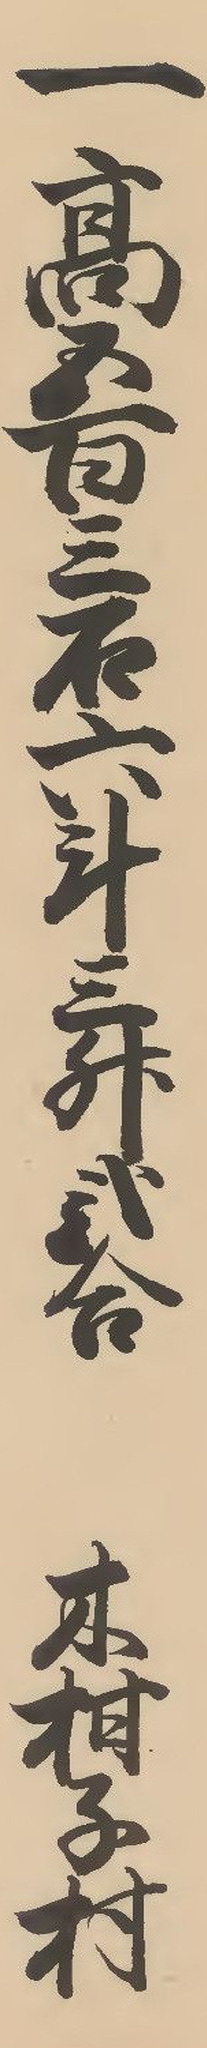一髙五百三石六斗三升弐合木柑子村
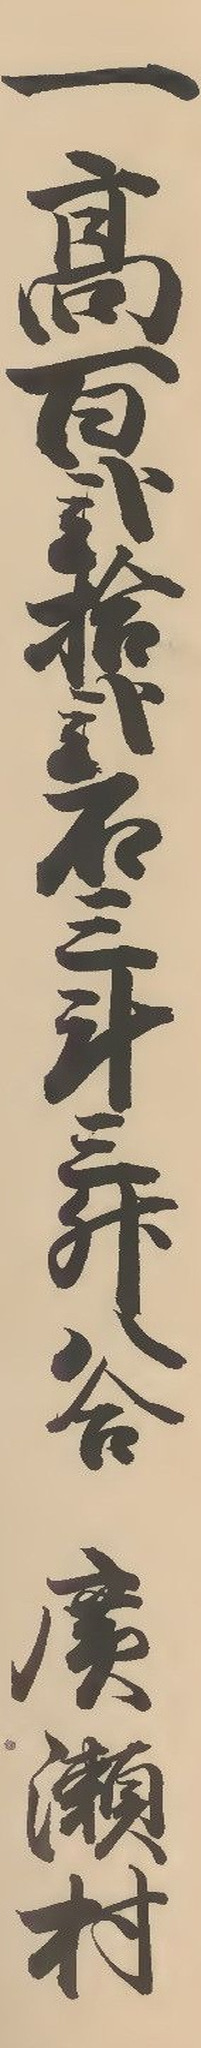一髙百弐拾弐石三斗三升八合廣瀬村
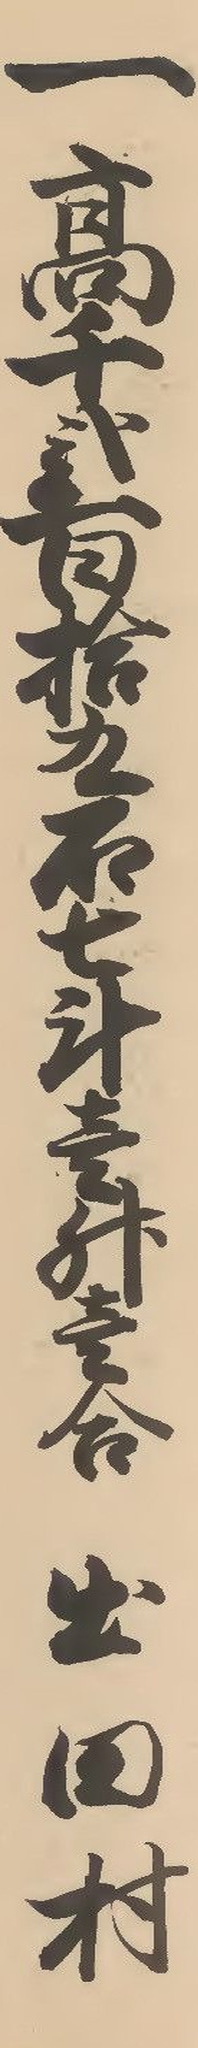一髙千弐百拾九石七斗壱升壱合出田村
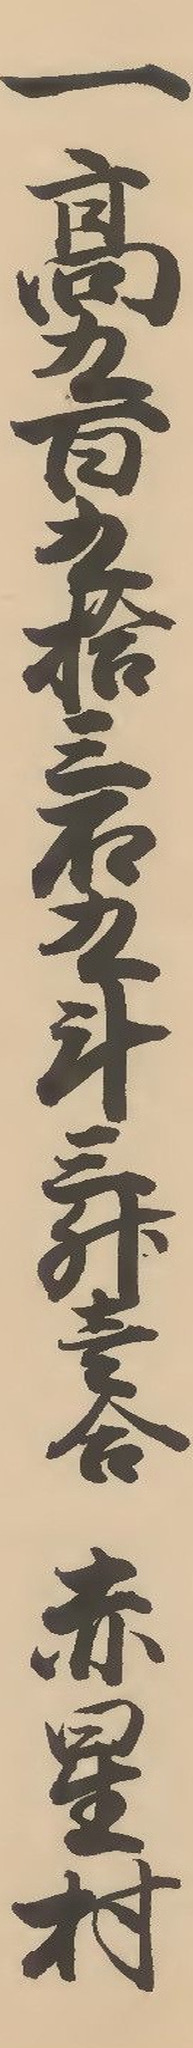一髙九百九拾三石九斗三升壱合赤星村
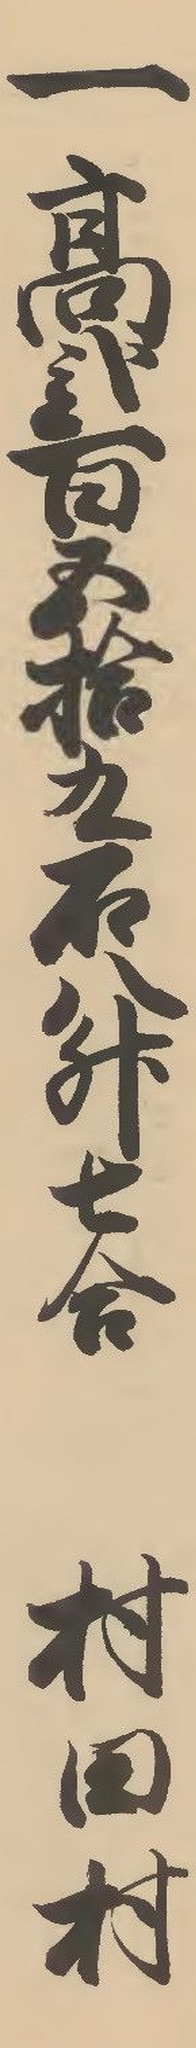一髙弐百五拾九石八升七合村田村
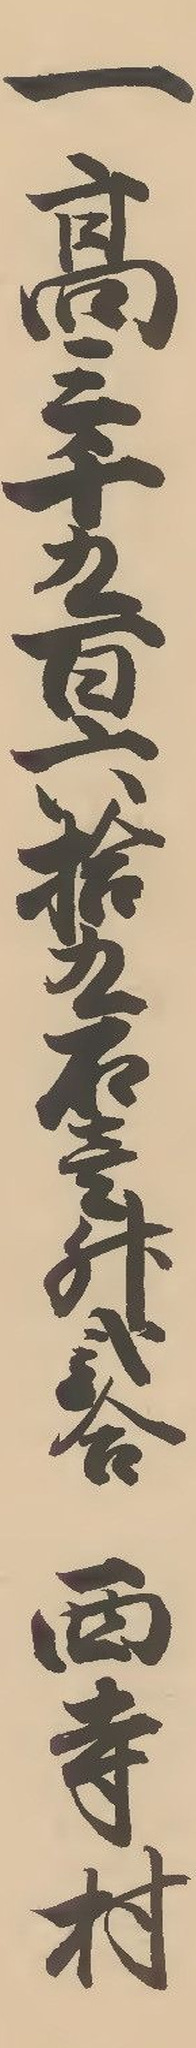一髙三千九百六拾九石壱升弐合西寺村

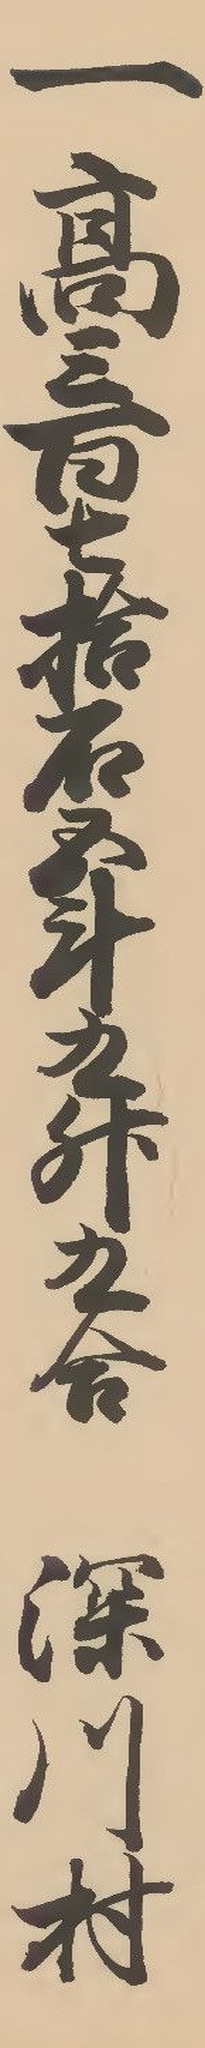一髙三百七拾石五斗九升九合深川村
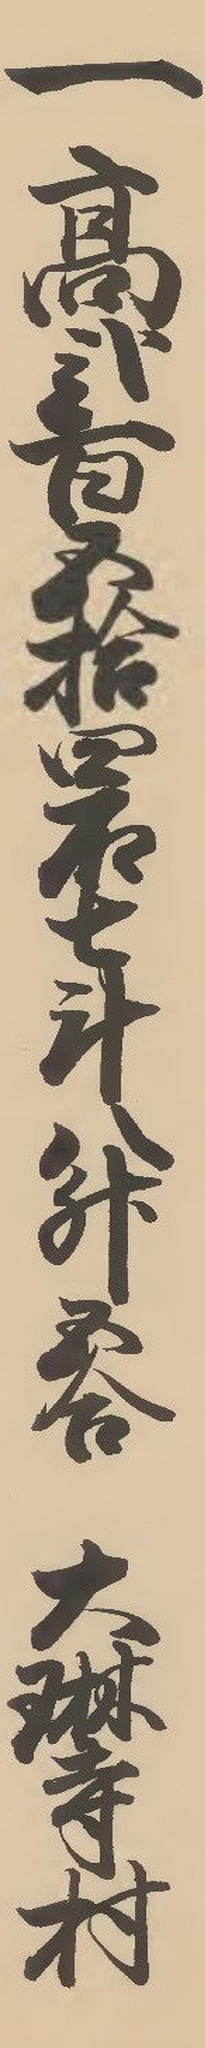一髙弐百五拾四石七斗八升五合大琳寺村
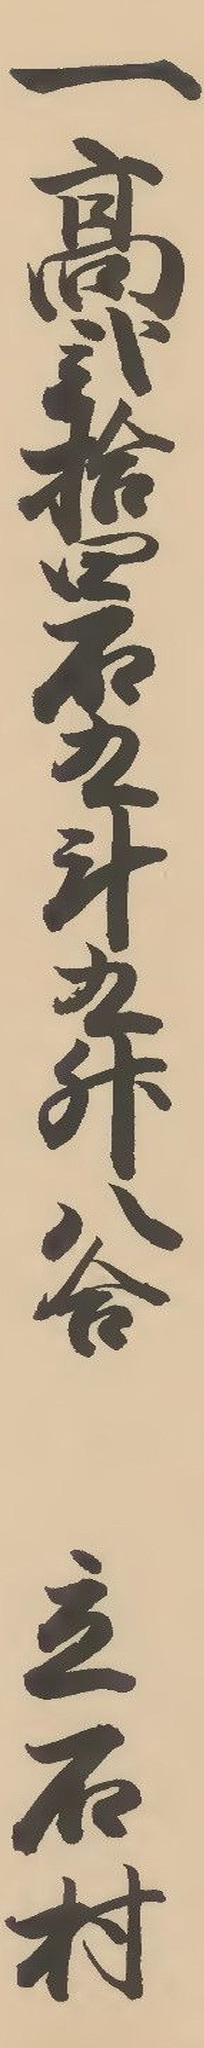一髙弐拾四石九斗九升八合立石村
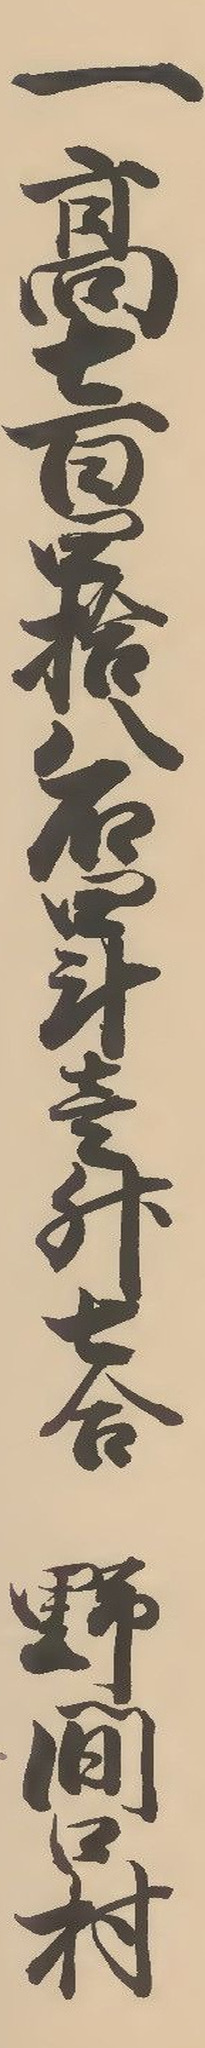一髙七百四拾八石四斗壱升七合野間口村
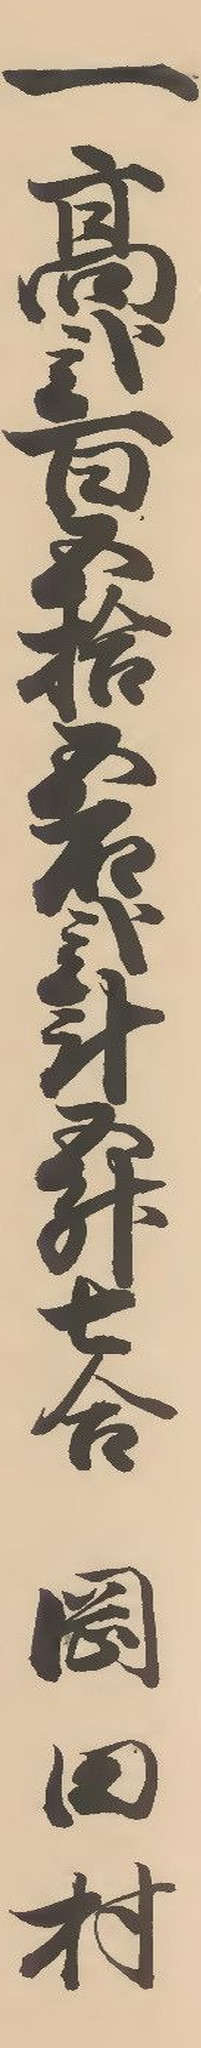一髙弐百五拾五石弐斗五升七合岡田村
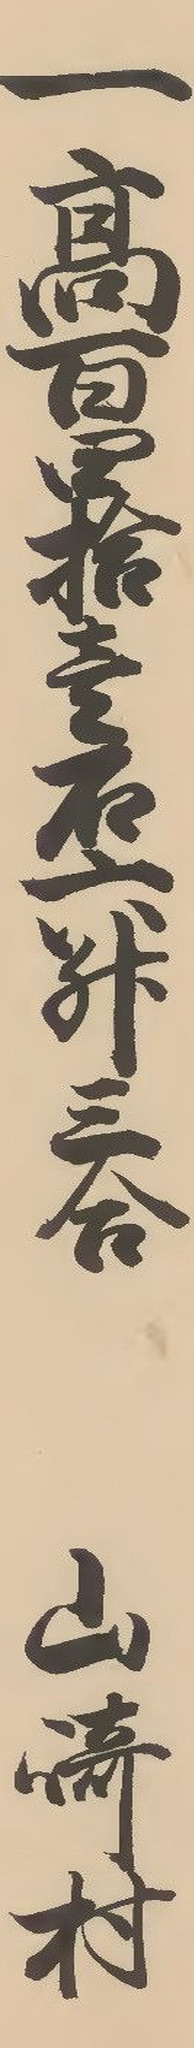一髙百四拾壱石六升三合山崎村
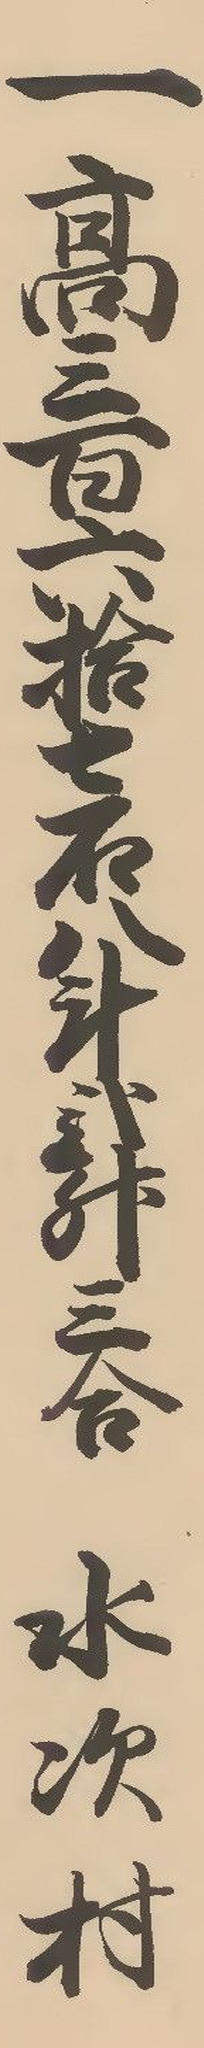一髙三百六拾七石八斗弐升三合水次村
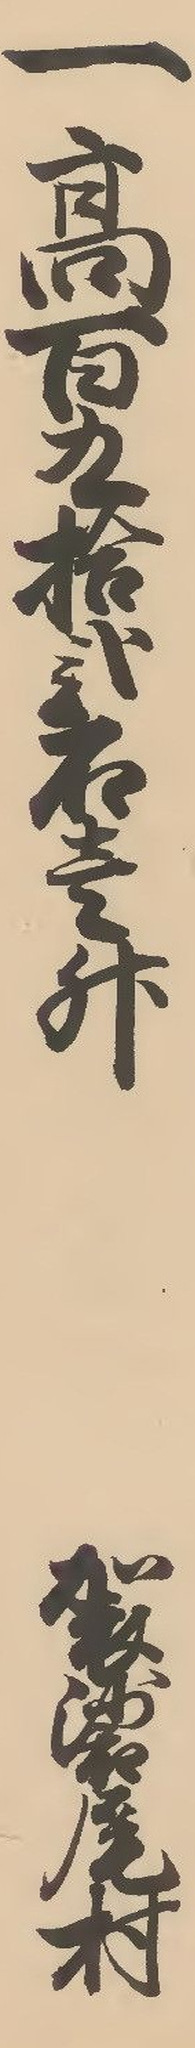一髙百九拾弐石壱升袈裟尾村

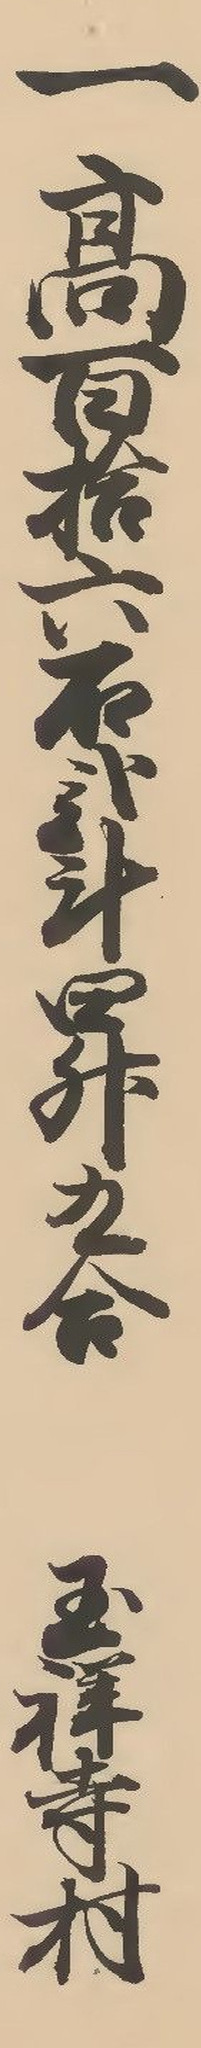一髙百拾六石弐斗四升九合玉祥寺村
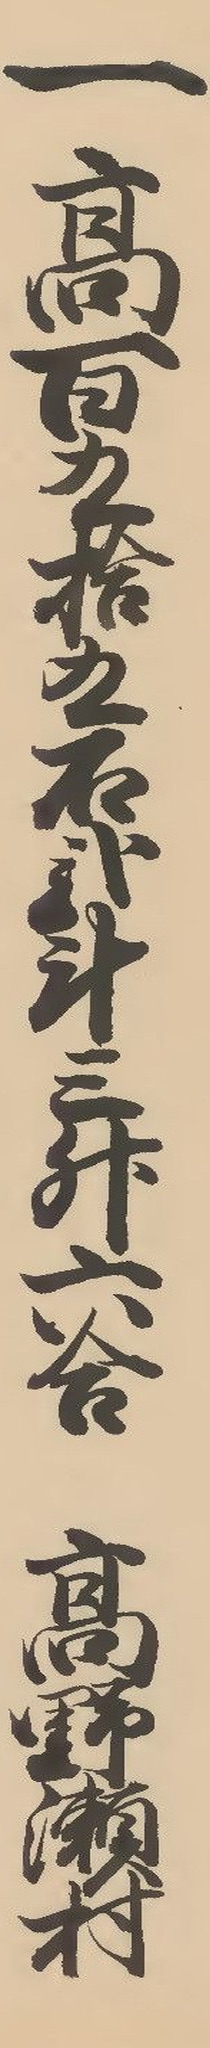一髙百九拾九石弐斗三升六合高野瀬村
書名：肥後国郷帳
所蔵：国立公文書館 National Archives of Japan
